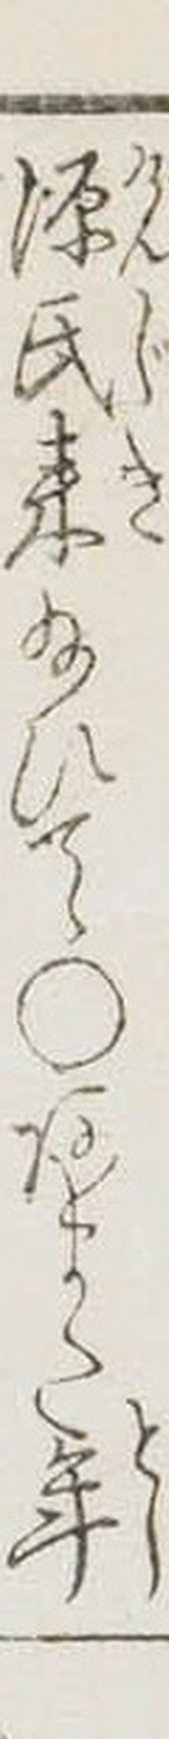源氏来給ひて○あまた年
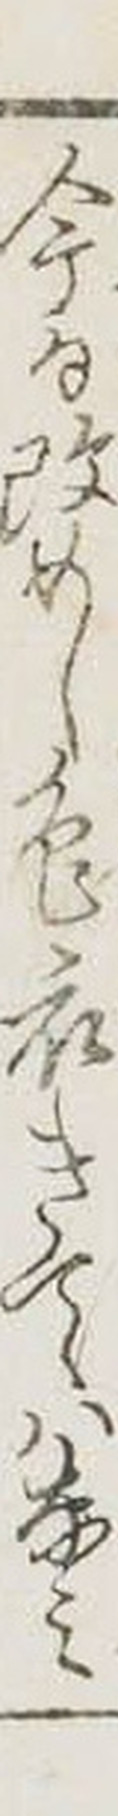今日改めし色衣きてはなみ
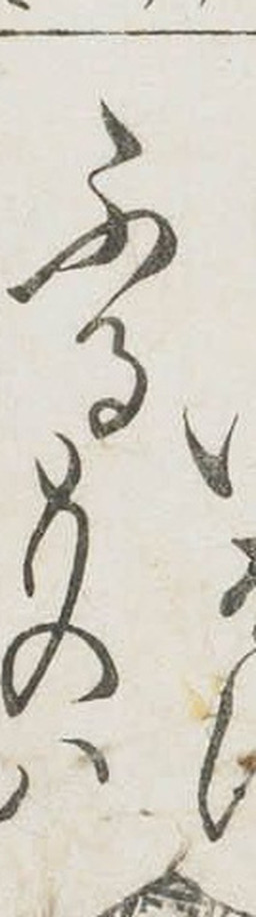ふるものは
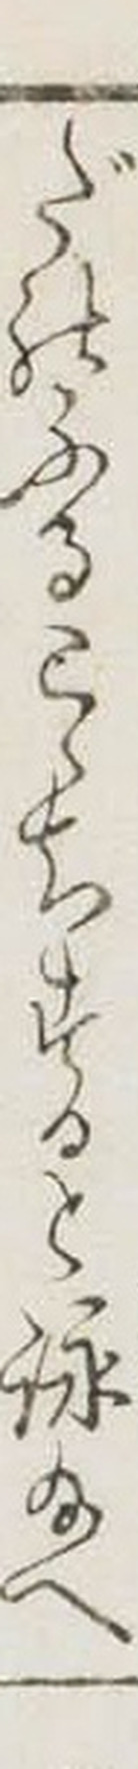だのふるこゝちすると詠給へ
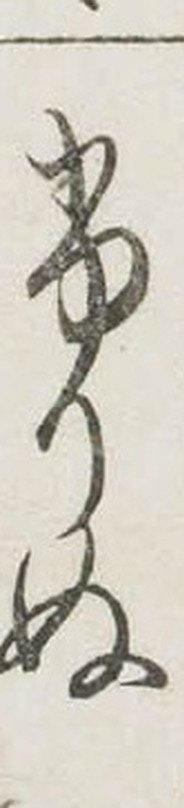ふりぬ
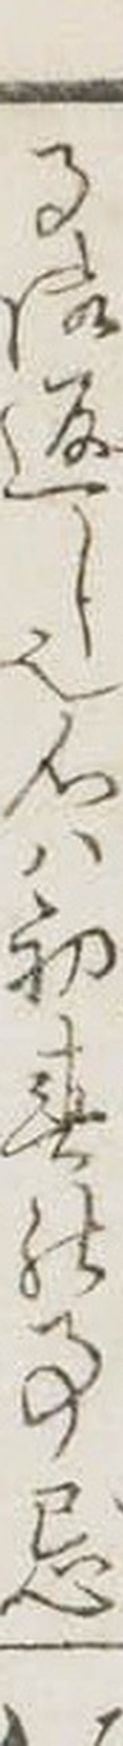る御返し也心は初春の事忌
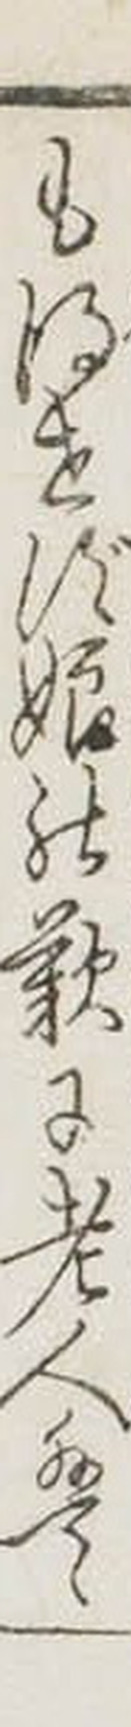も得せず娘の歎に老人は
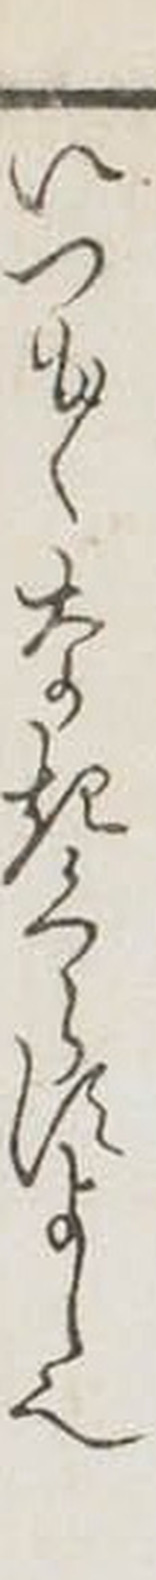いつも〳〵なきくらすよし也

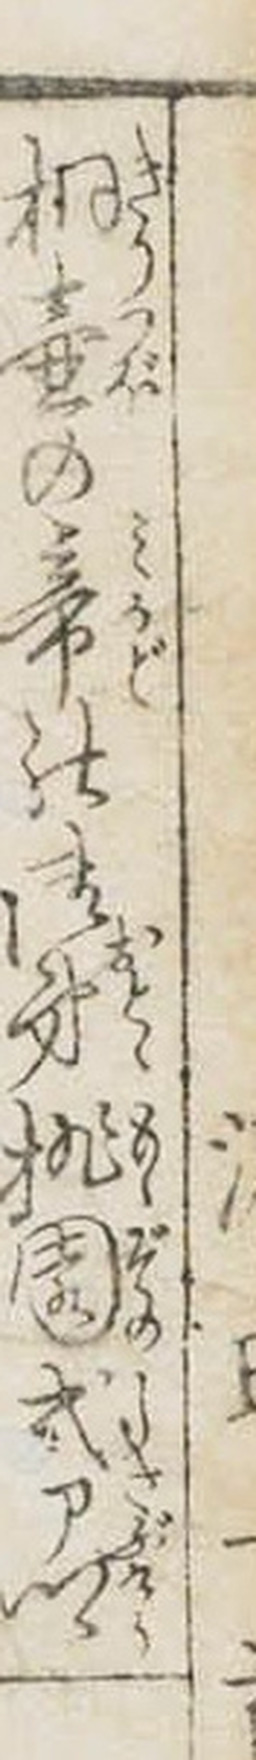桐壺の帝の御弟桃園式部卿
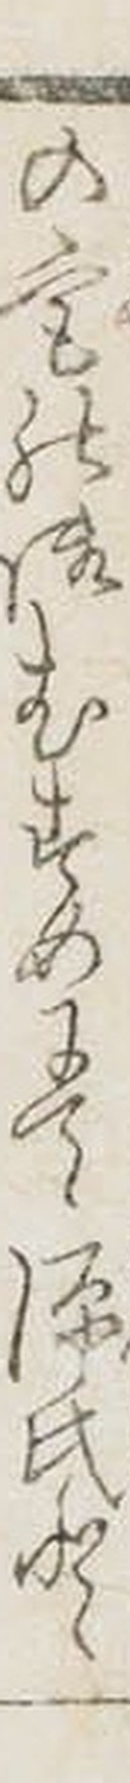の宮の御むすめは源氏と
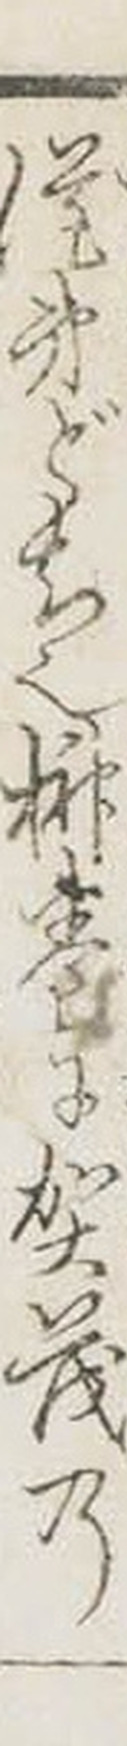従弟どち也榊巻に賀茂の
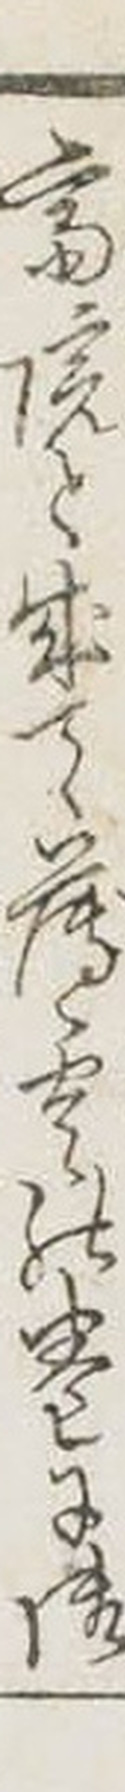斎院と成て薄雲の巻に御
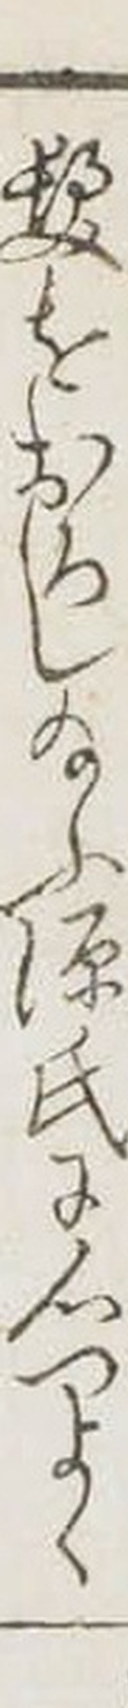髪をおろし給ふ源氏に心つよく
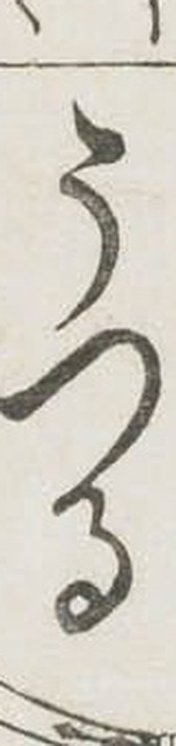うつる
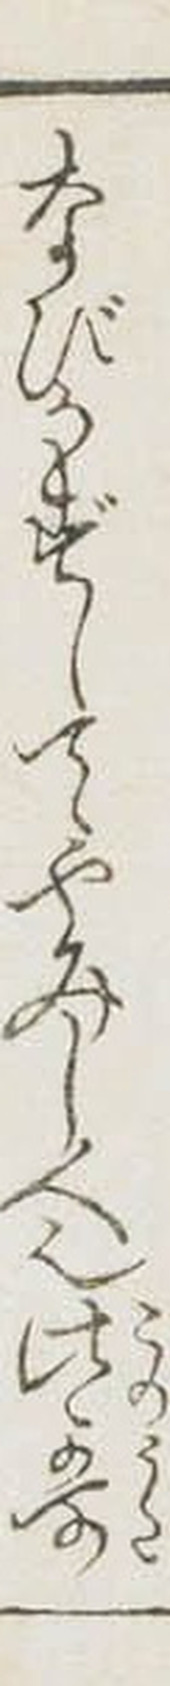なびかずしてやみし人也此哥
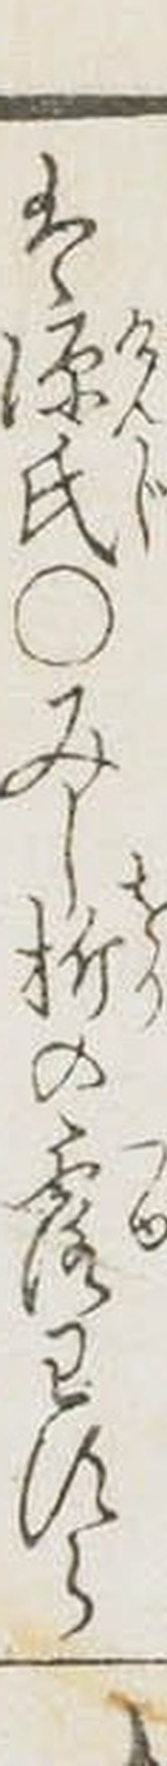は源氏○みし折の露わすら
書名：源氏百人一首
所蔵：東京学芸大学教育コンテンツアーカイブ
